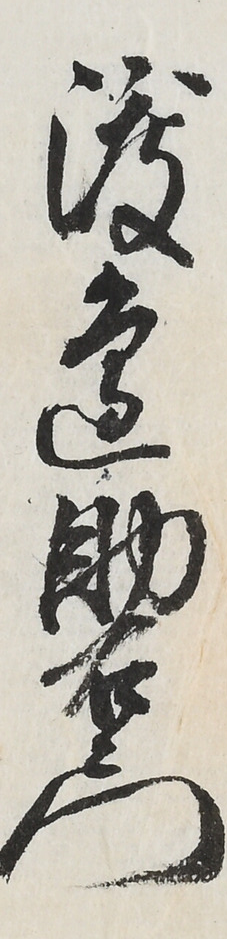渡辺助右衛門
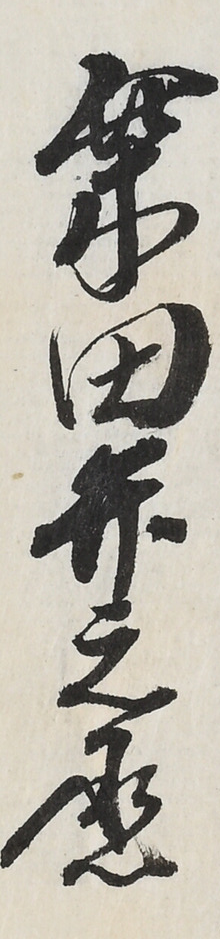柴田弁之丞
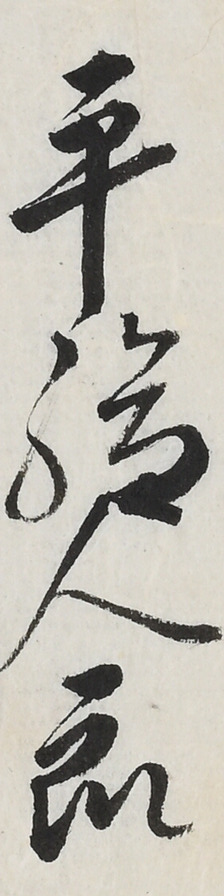平給人衆
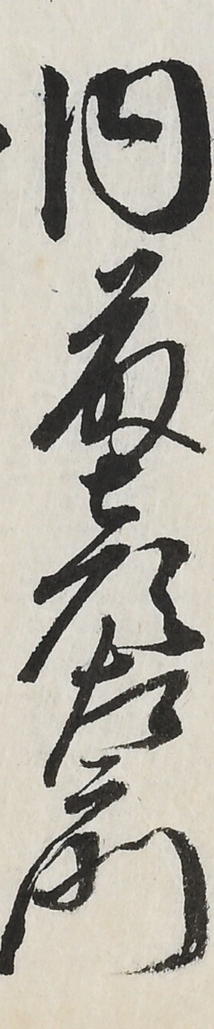内藤彦左衛門
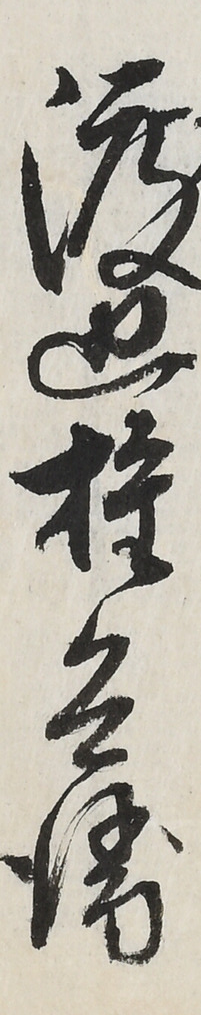渡辺権兵衛
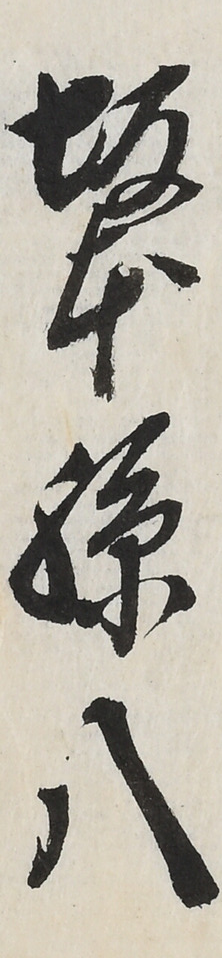坂本孫八
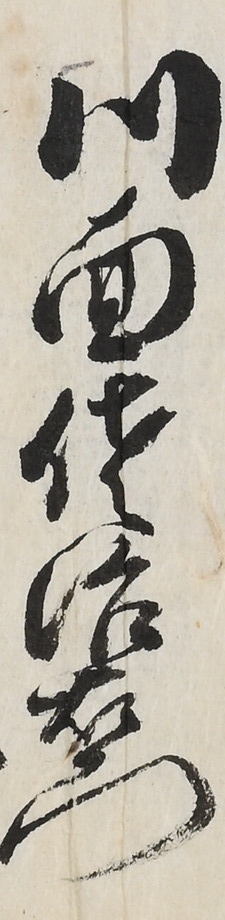川面佐治右衛門
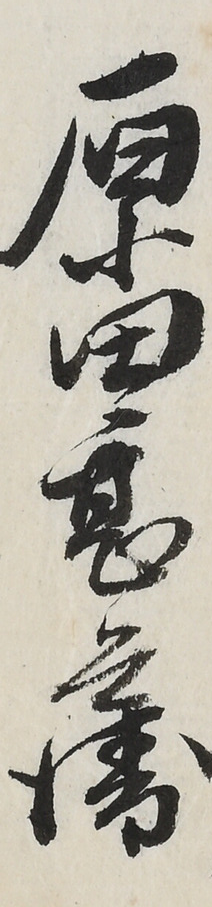原田甚兵衛
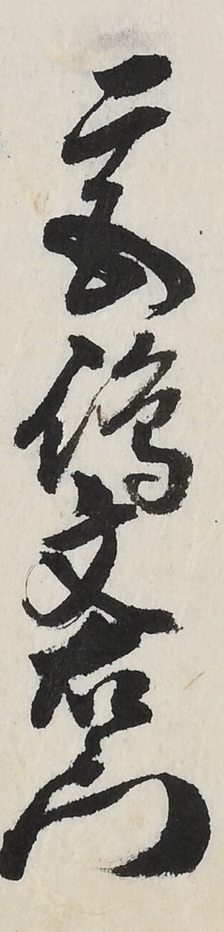宮嶋文右衛門
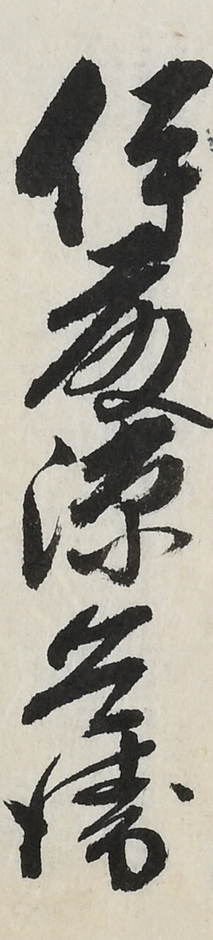伊藤源兵衛
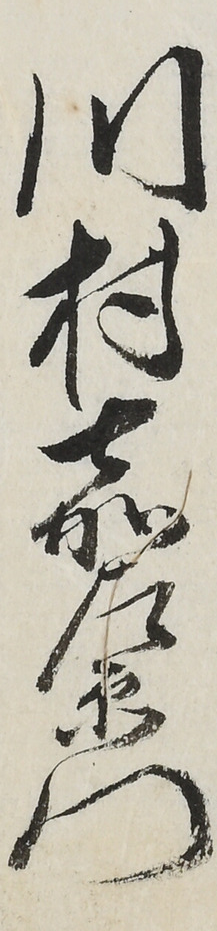川村嘉左衛門
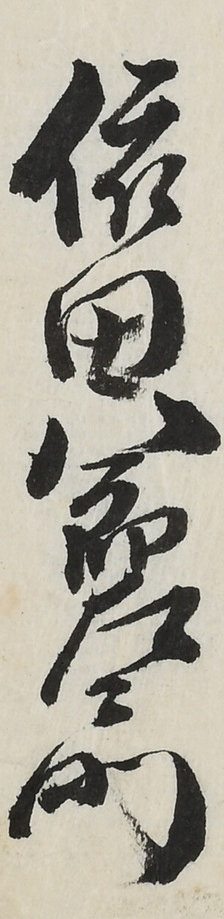依田八郎左衛門
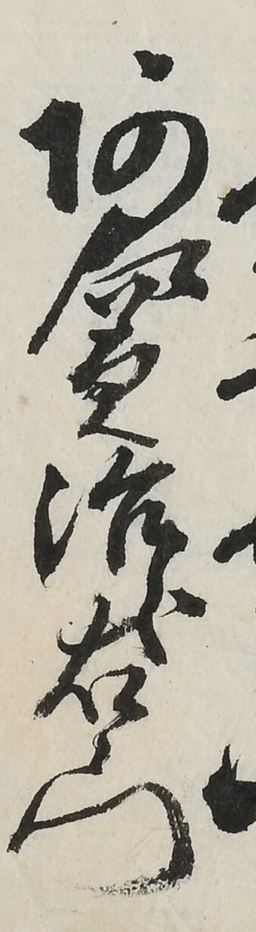阿左美治郎右衛門
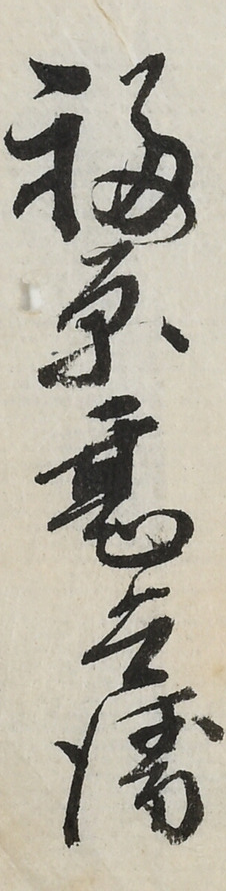福原甚兵衛

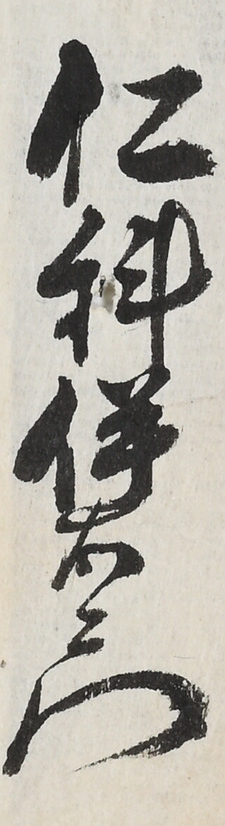仁科伴右衛門
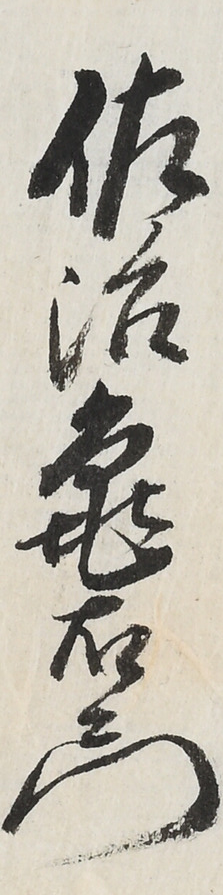佐治亀右衛門
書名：高遠江戸徒以上之面々
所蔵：伊那市立高遠町図書館・合同会社AMANE
